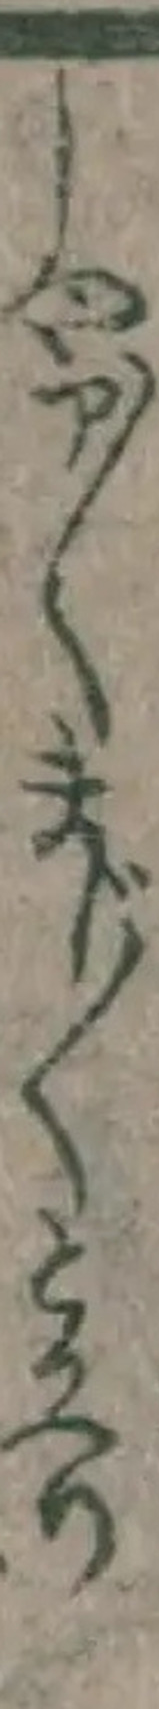しやア〳〵まじ〳〵とかへり
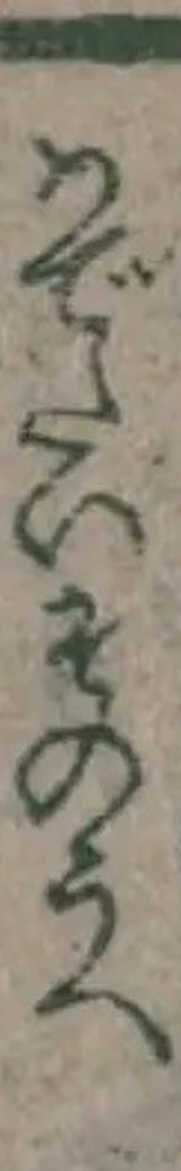めでたいそのうへ
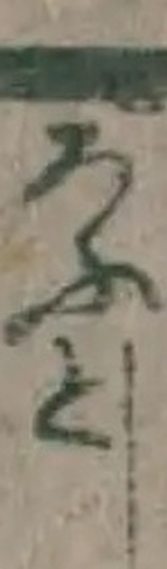ろふと
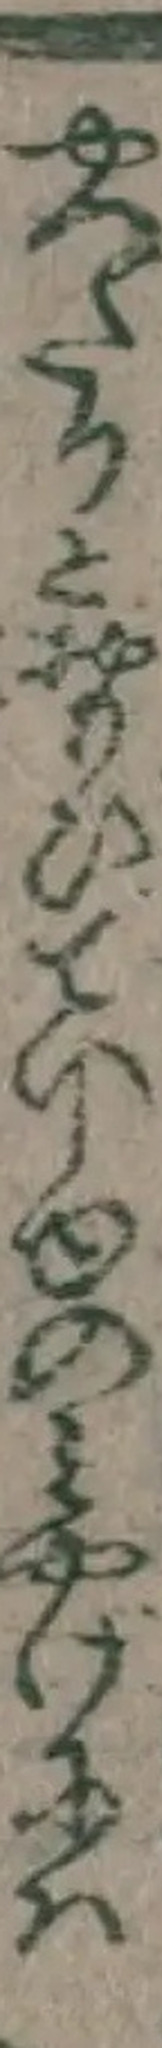やつたりとおもひていしゆのみやげには
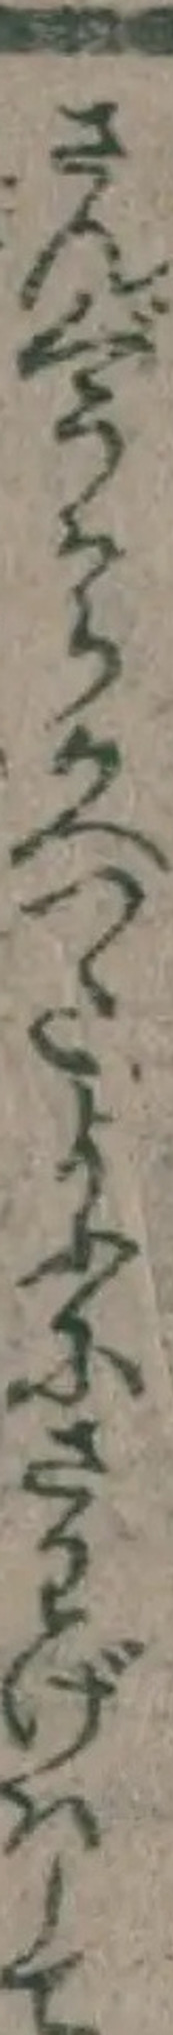さんぐうからかへつたよふにさわげはして
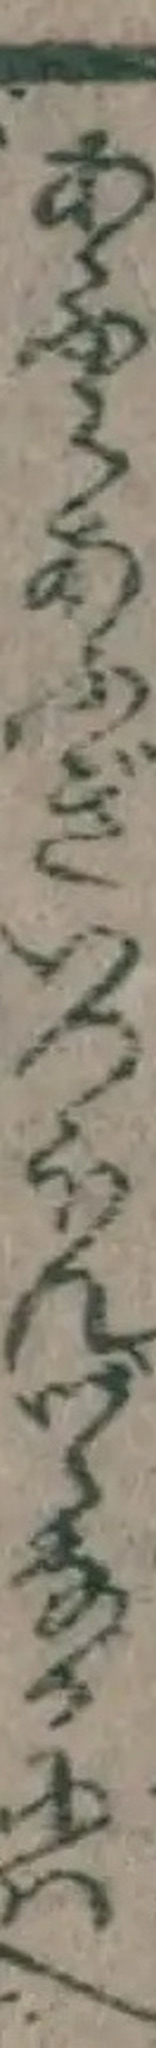あふらあふぎいつほんづゝなかには
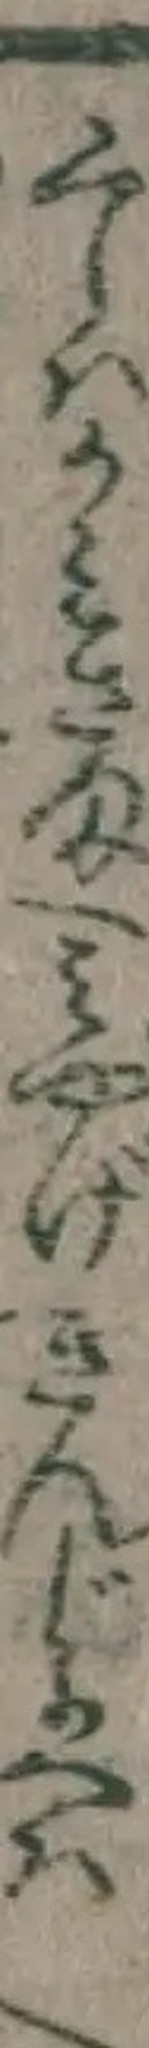くしはかみさまへみやげきんじょへは
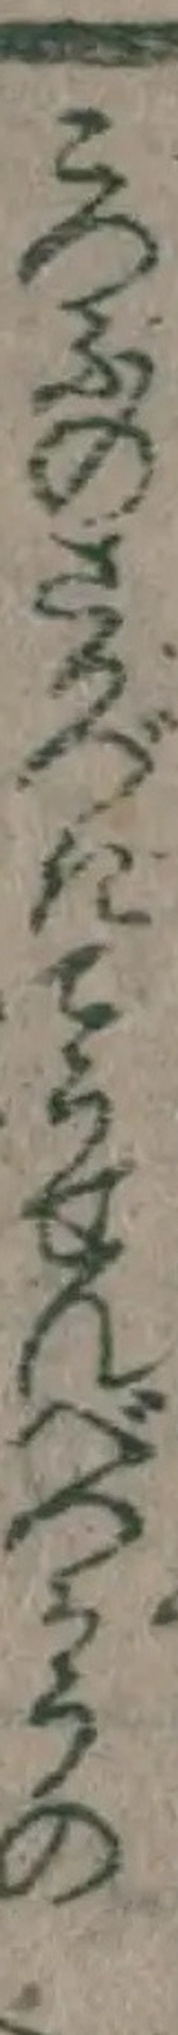こつふのさかづきてうせんべつかうの
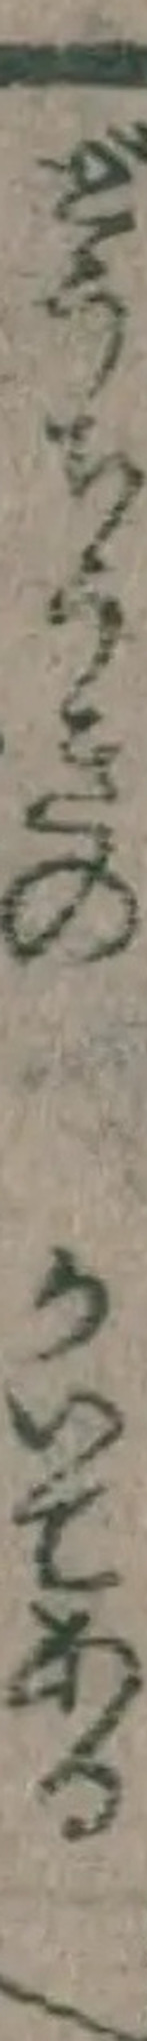どうちうきのかいてある
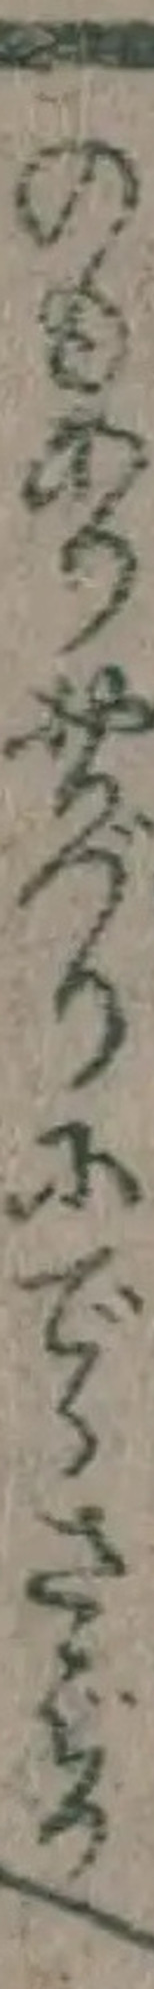のもありおかづりにでゝさばか
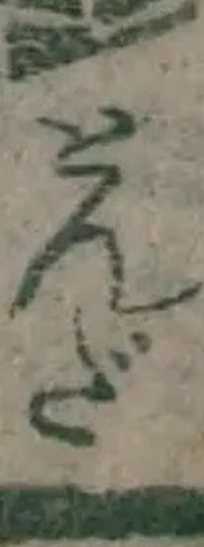とんだ
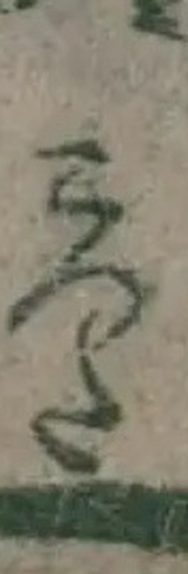こつた

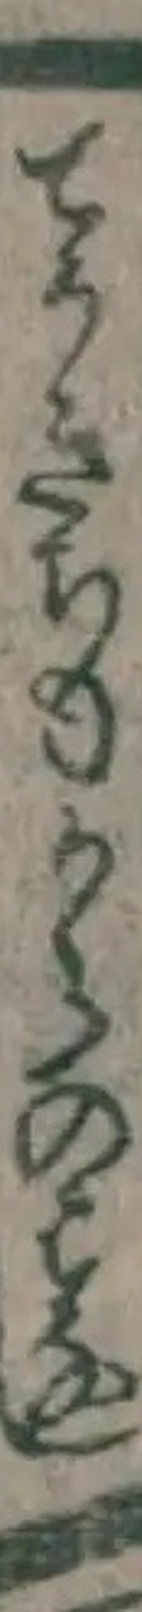てうきちもからのはなし
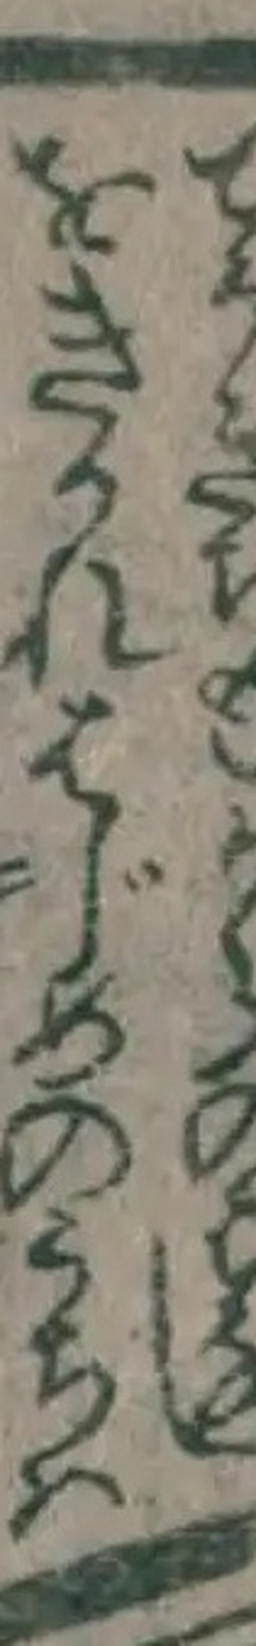をきかれはじめのうちは
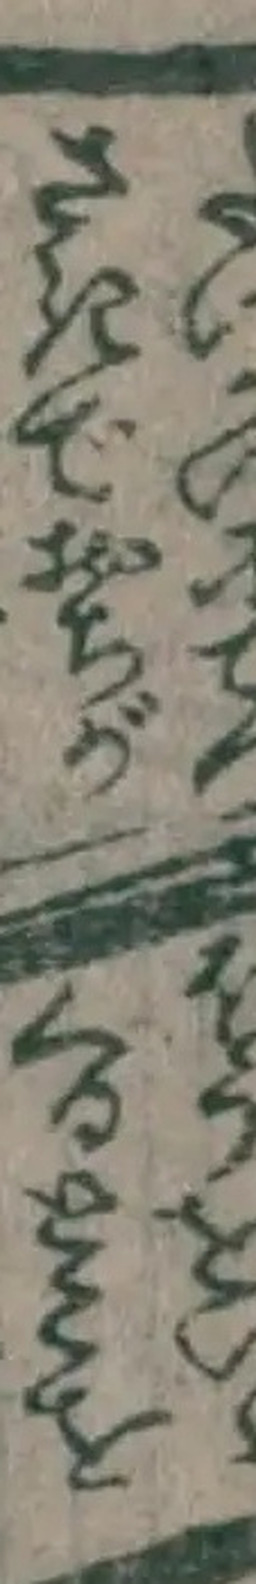さきでおちがくるとこを
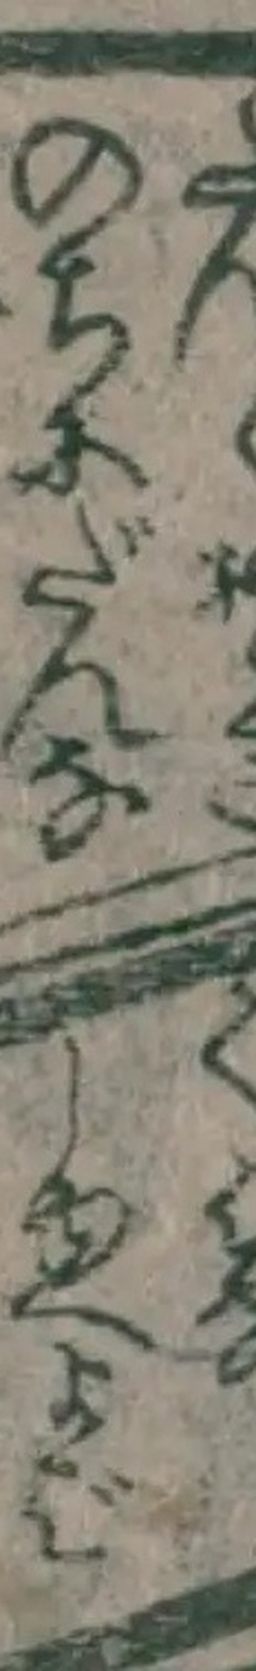のちにだんなしゅへよば
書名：縦筒放唐の噺 3巻
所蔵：国立国会図書館 National Diet Library, JAPAN
